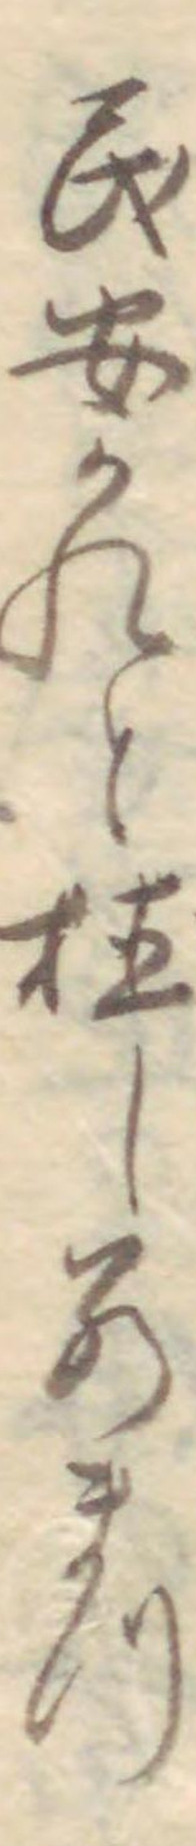民安かれと植し若まつ
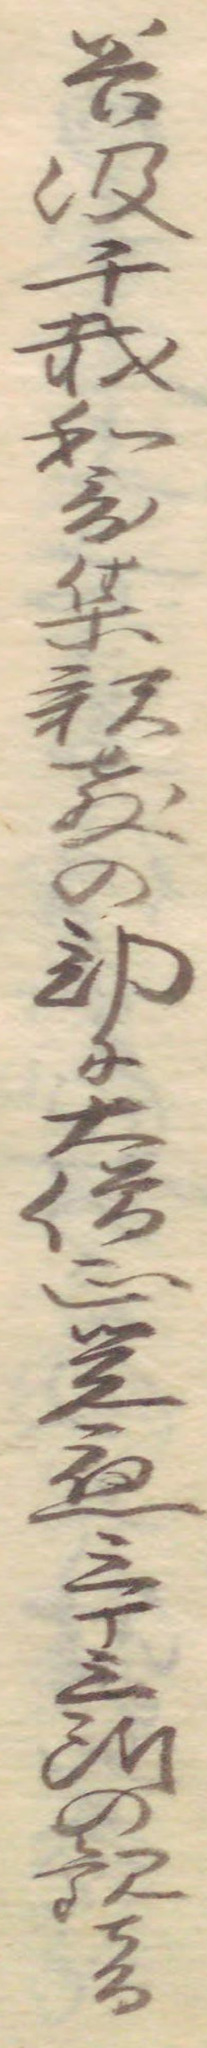谷汲千載和歌集釈教の部に大僧正覚應三十三所の観音

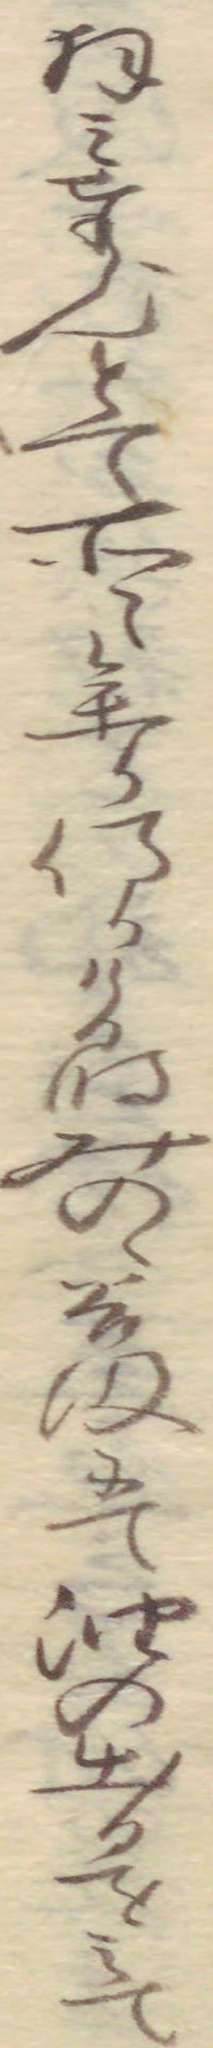拝み奉らんとて所〻参り侍りける時みのゝ谷汲にて油の出るをみて
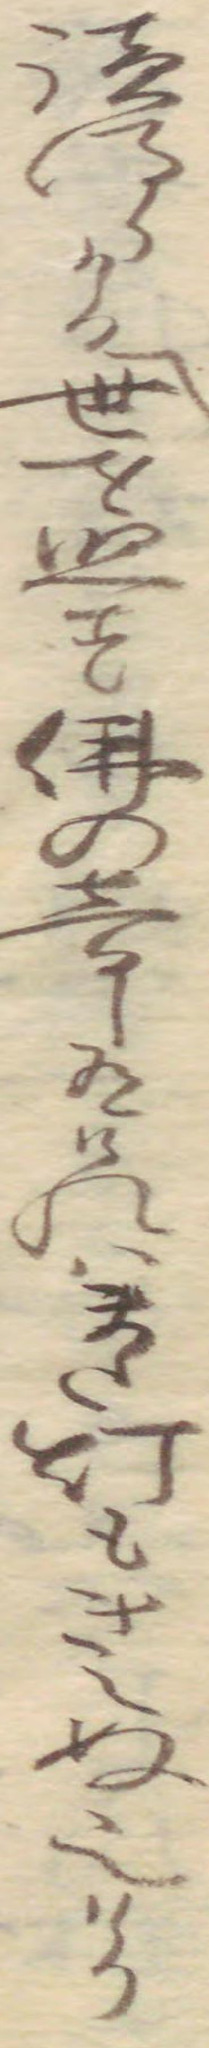読侍りける〽世を照す仏のしるし有けれはまた灯もきえぬ也けり
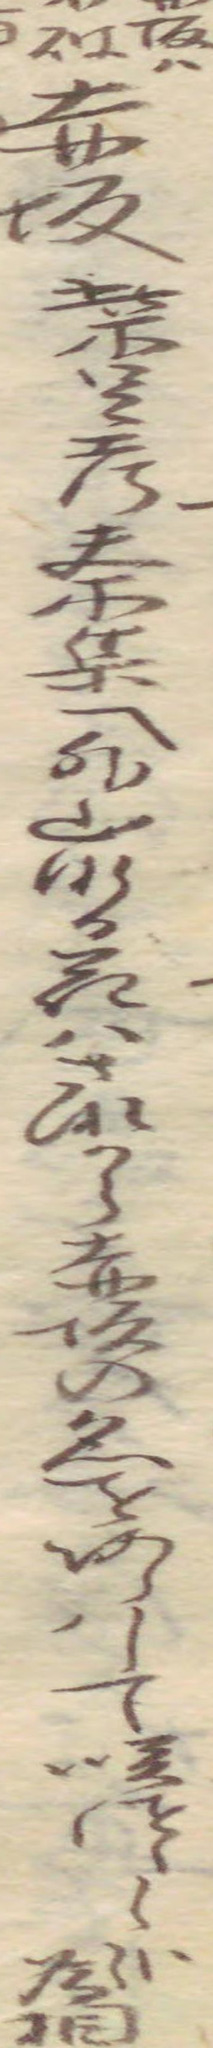赤坂柴足考夫木集〽外山なる花はさなから赤坂の名をあらはして咲つゝし哉為相
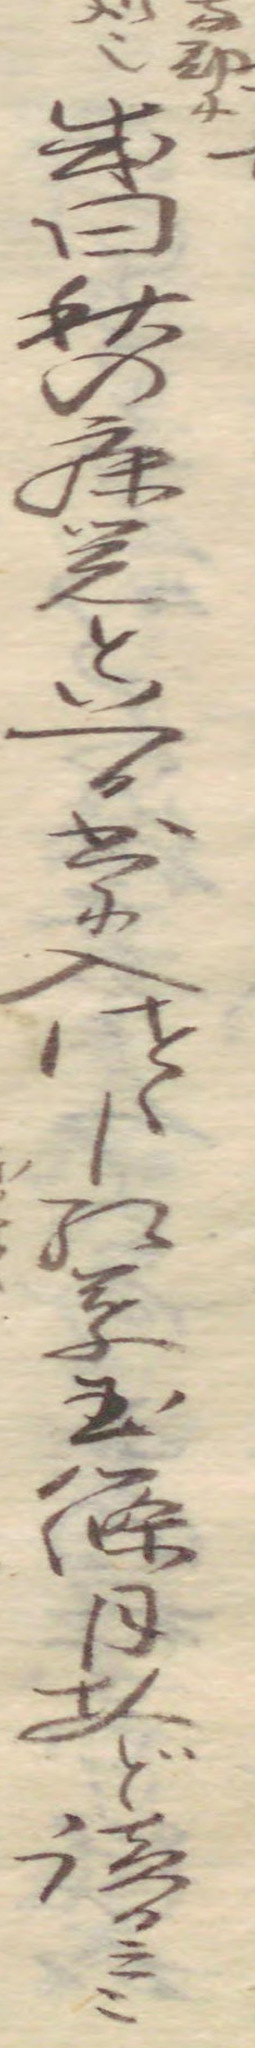或云秋の寝覚といへる書に入つゝし紅葉玉篠月など読る云〻
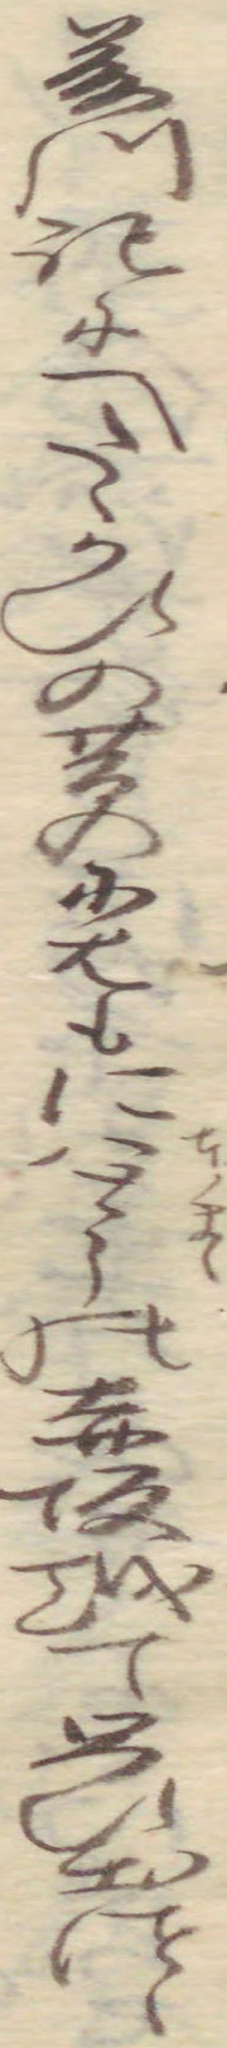藤川記に〽たゝかひの昔のにはもにはとうの赤坂越て思ひ出つゝ
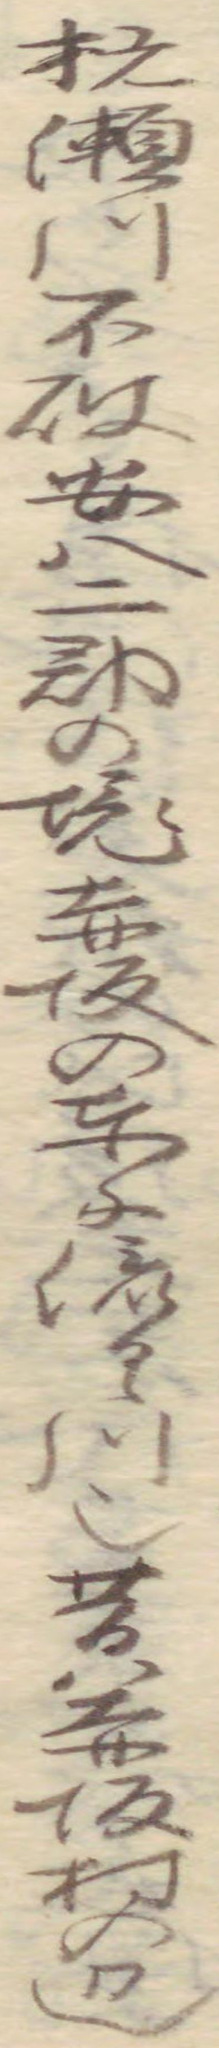杭瀬川不破安八二郡の境赤坂の東に流るゝ川也昔は赤坂村の辺
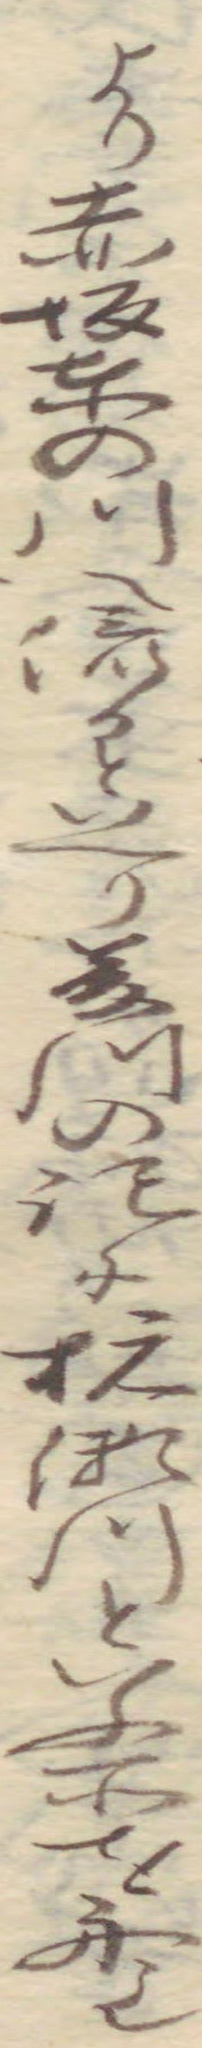より赤坂東の川へ流るといへり藤川の記に杭瀬川といふ所を舟ニて
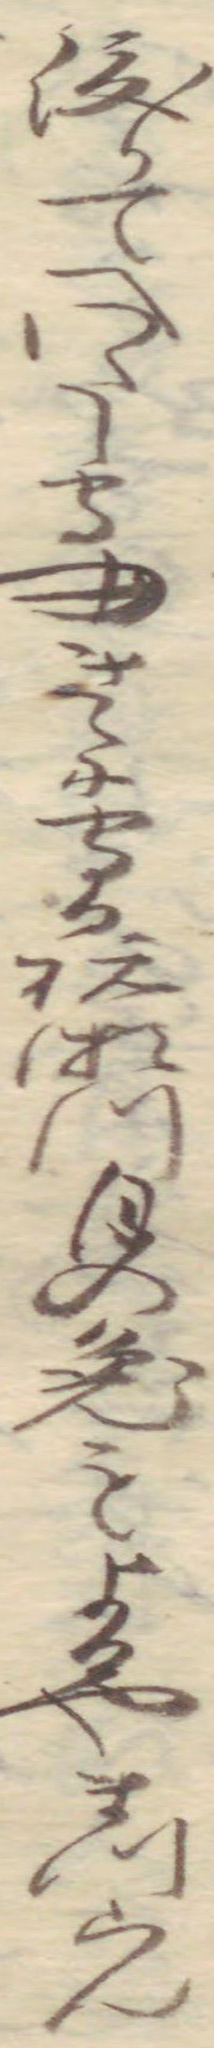渡りて〽わたし守ゆきゝに守る杭瀬川月の兔もよるやまつらん
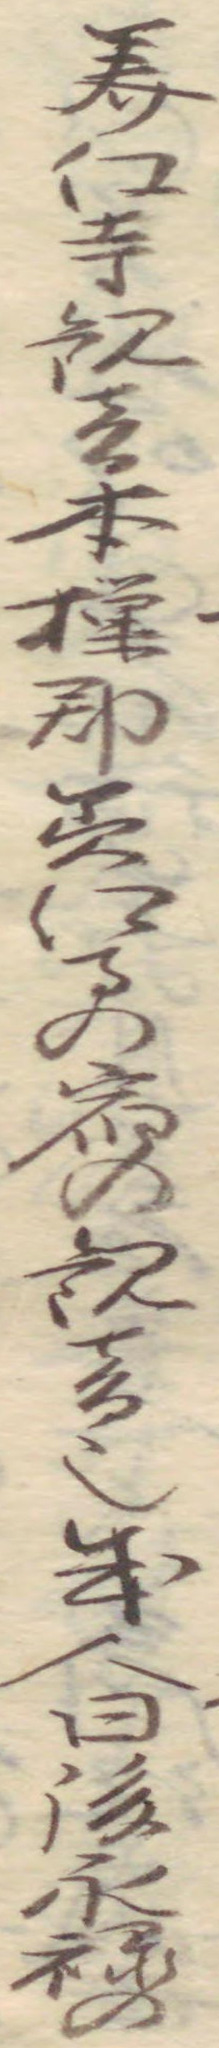美江寺観音本樔郡美江寺の宿の観音也或人曰後永禄の
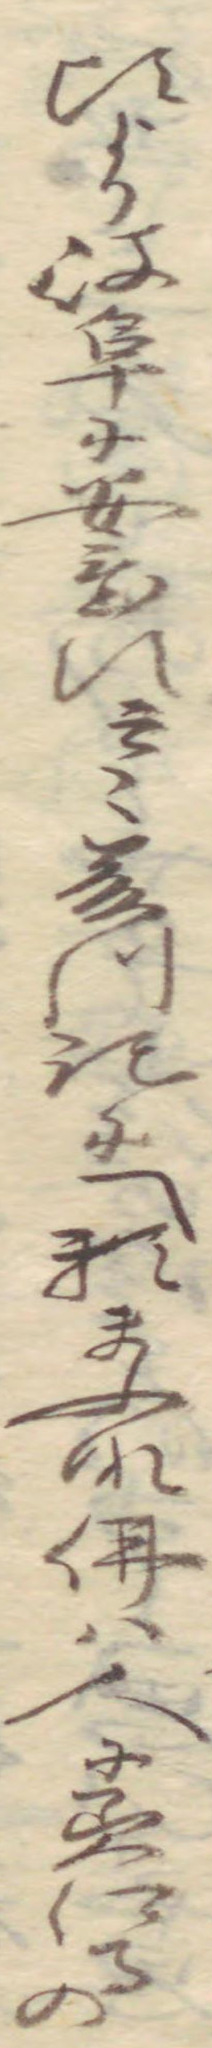頃より岐阜に安置す云〻藤川記に〽頼まふな仏は人二美江寺の
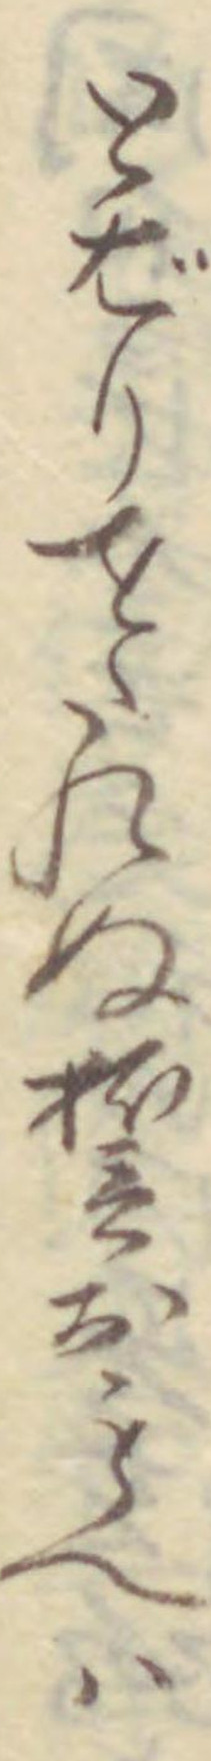とばりを垂れぬ誓おもへは
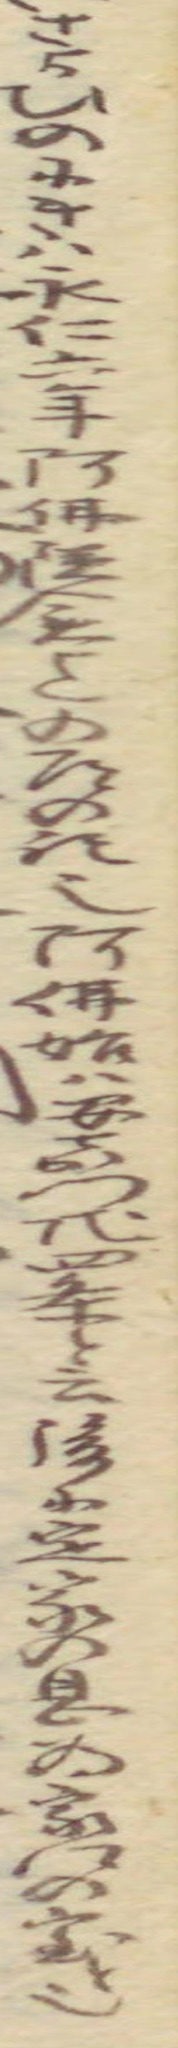いさよひのにきは永仁六年阿仏鎌倉迄の道の記也阿仏始は安嘉門院四条と云後に定家の息為家卿の室と也為世卿
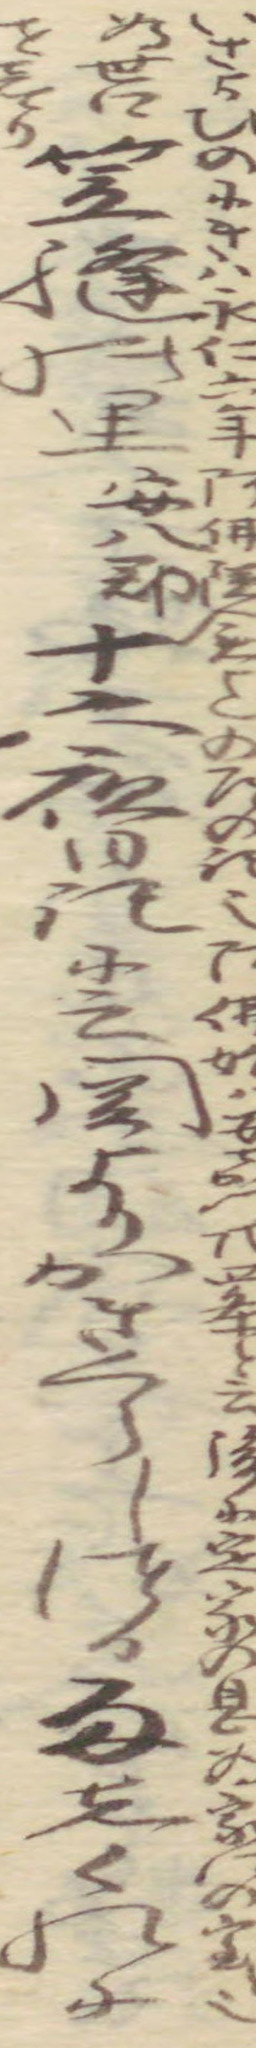笠縫の里安八郡十六夜日記に云関よりかきくらしつる雨しくれに
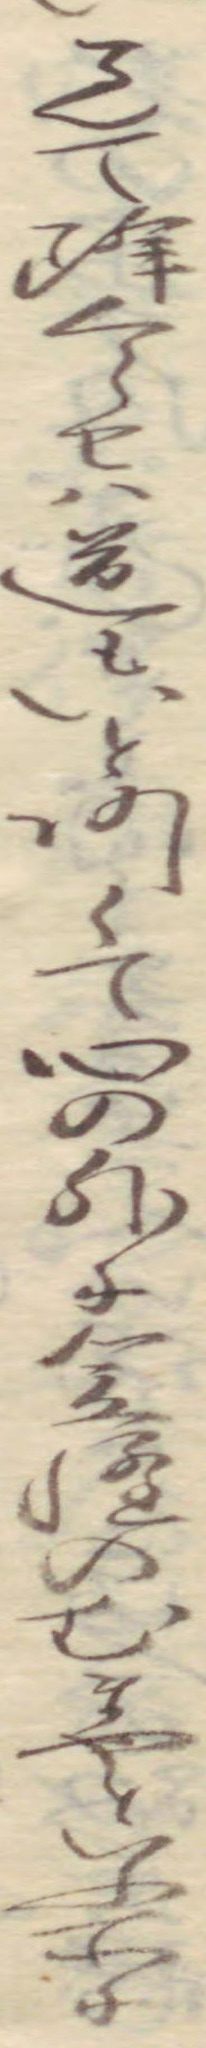過て降くらせは道もいとあしくて心の外に笠縫のむまやといふ所に
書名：鶯宿雑記. 巻263-264
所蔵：国立国会図書館 National Diet Library, JAPAN
